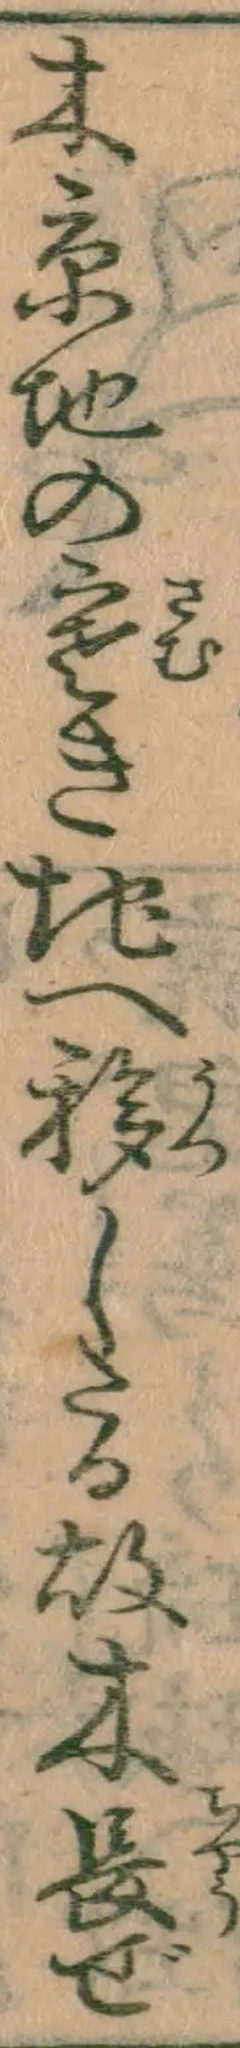木京地の寒き地へ移したる故木長ぜ
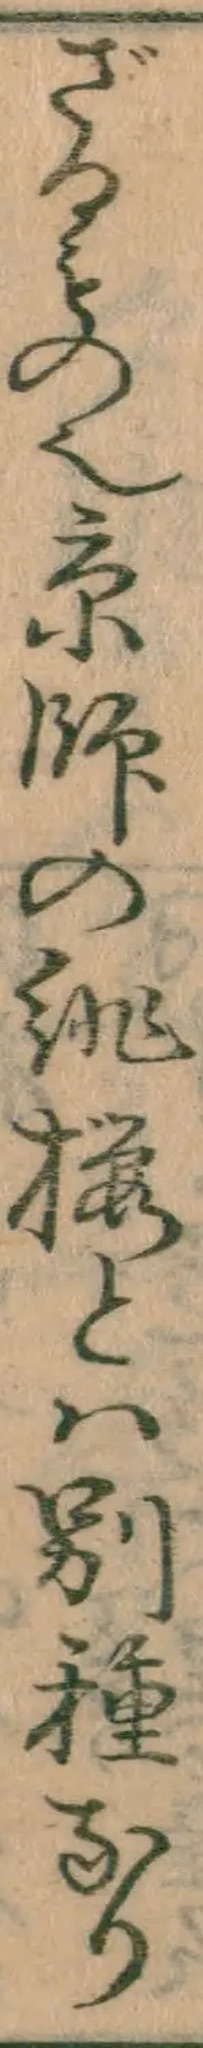ざるもの也京師の緋桜とは別種なり
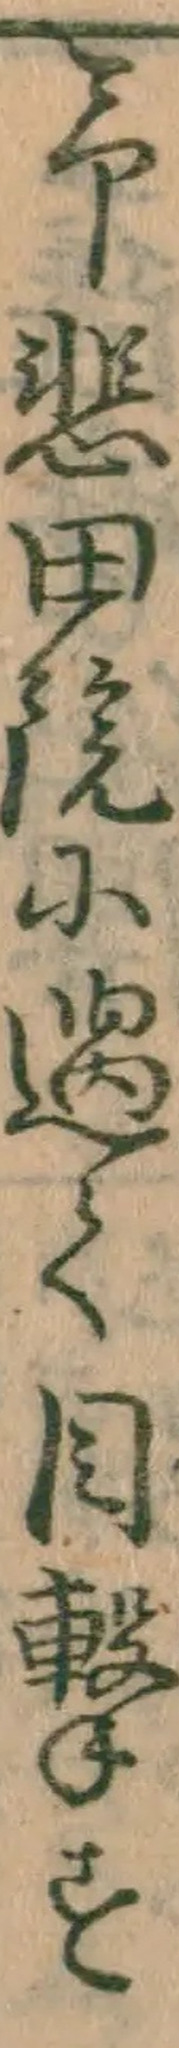予悲田院に邁て目撃す

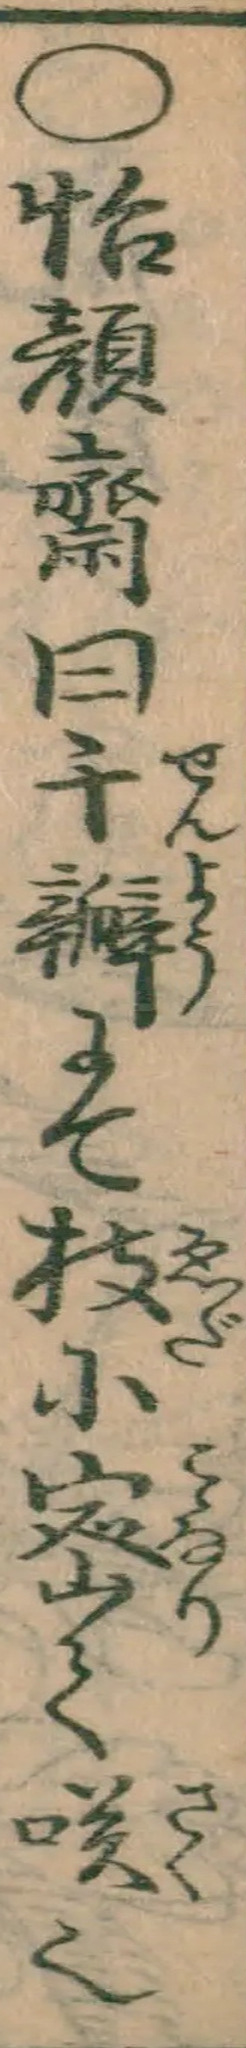○怡顔斎曰千弁にて枝に密て咲也
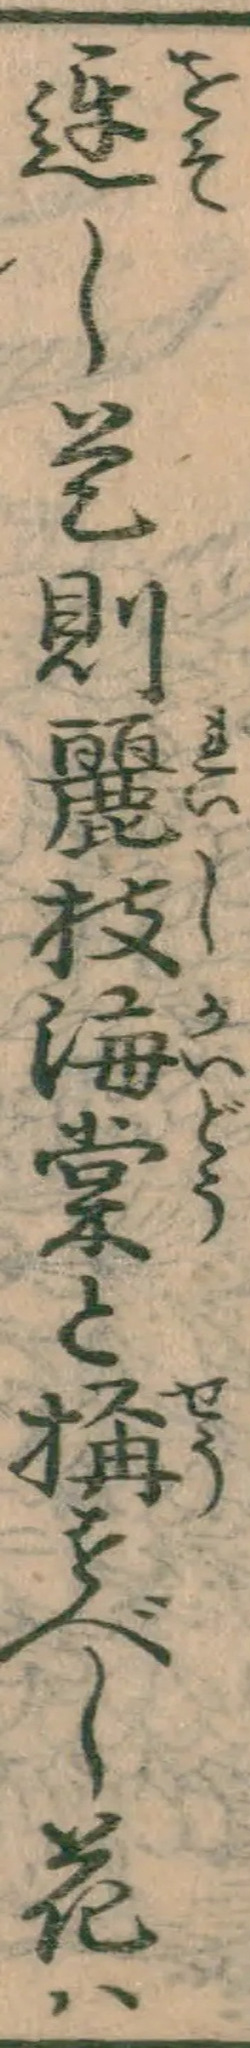遅し是則麗枝海棠と称すべし花は
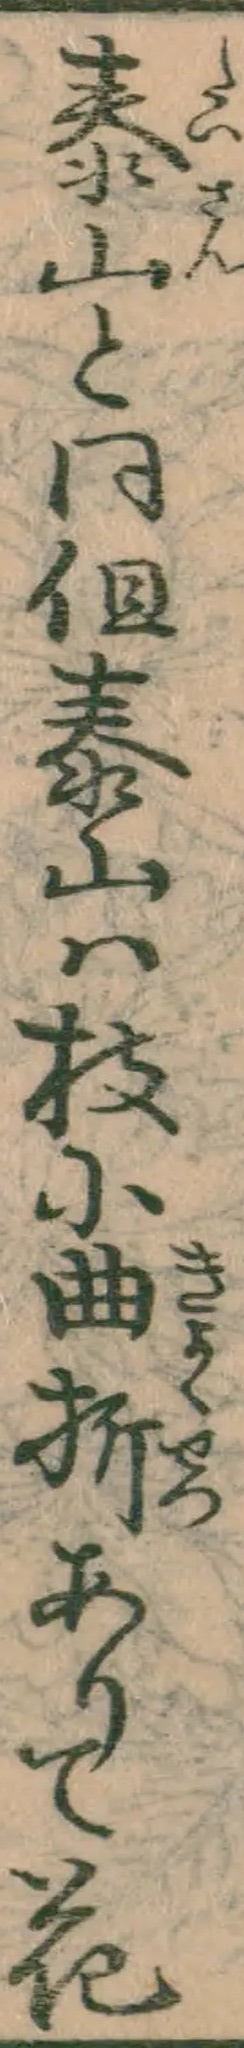泰山と同但泰山は枝に曲折ありて花
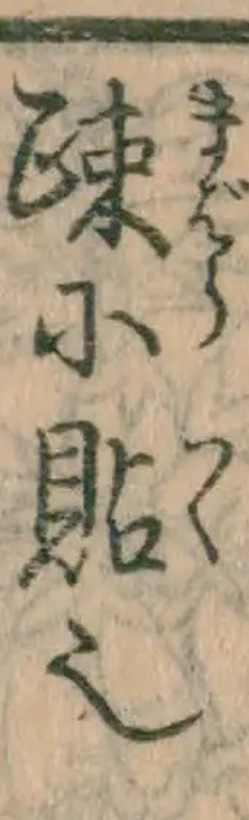疎に貼也
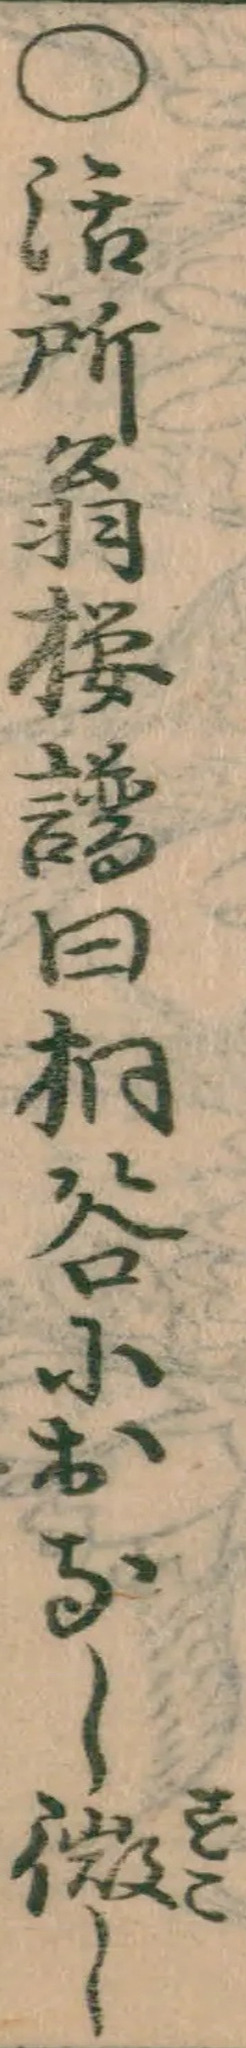○活所翁桜譜曰桐谷におなし微し
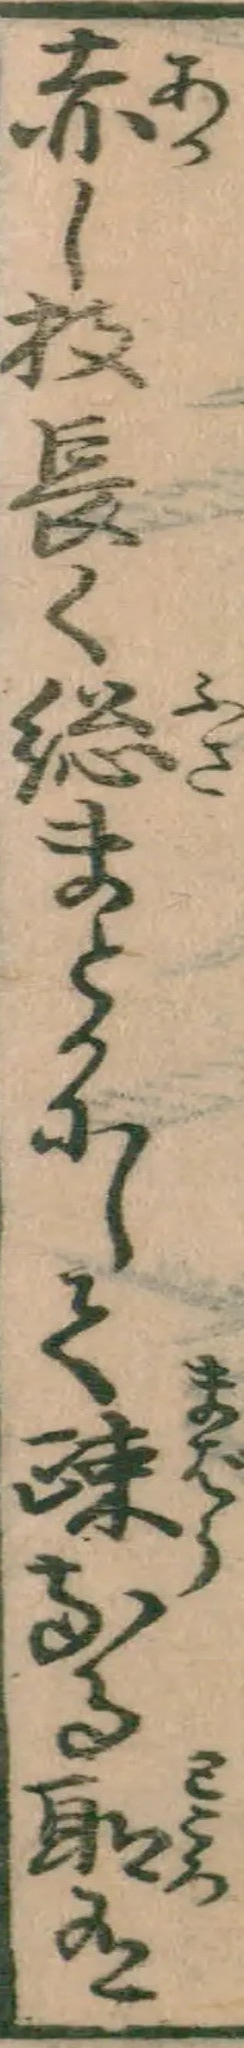赤し枝長く総まとかにして疎なる所有
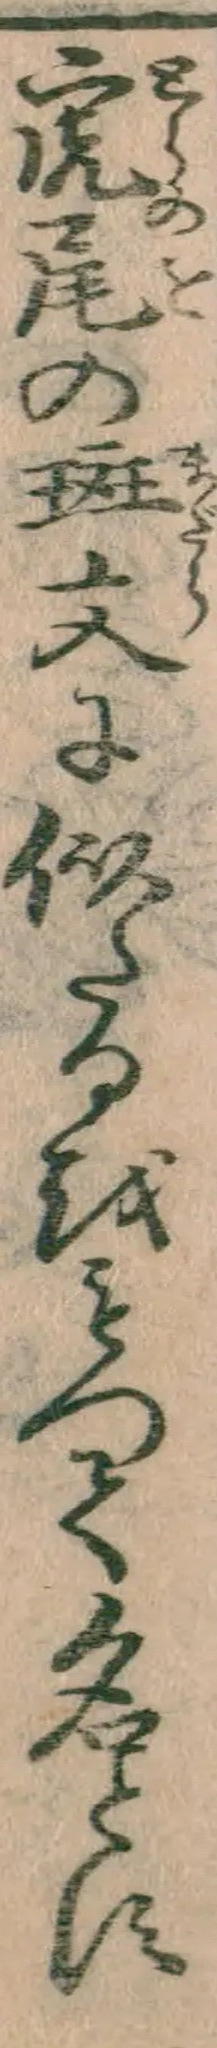虎尾の斑文に似たるをもつて名とす
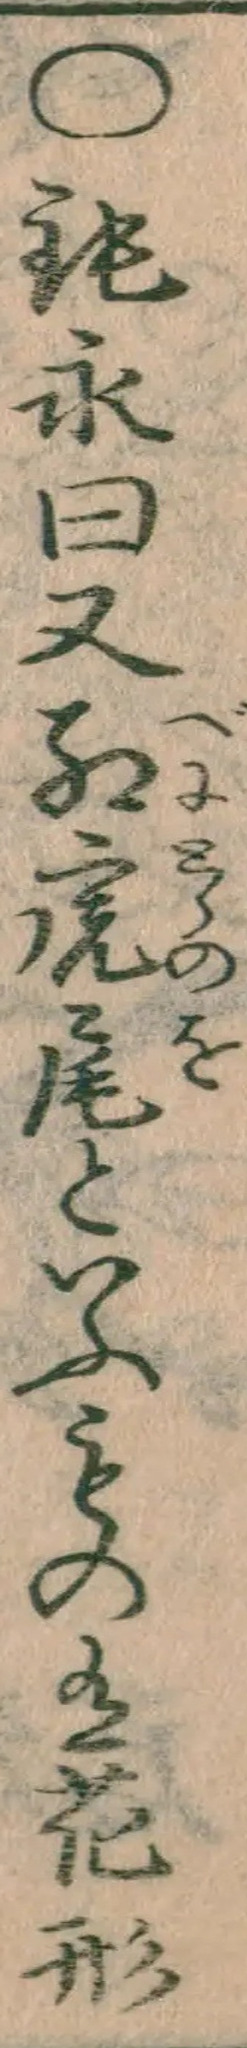○鈍永曰又紅虎尾といふもの有花形
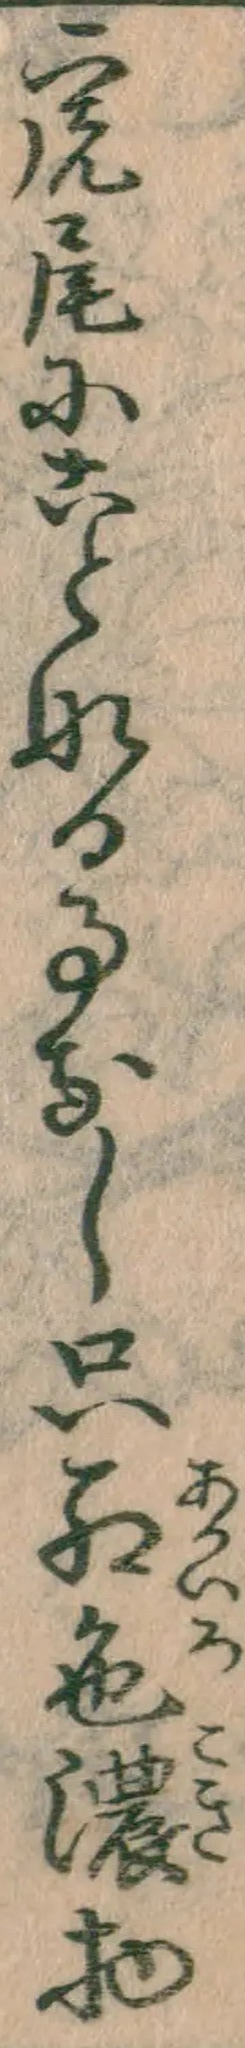虎尾にことなる事なし只紅色濃物

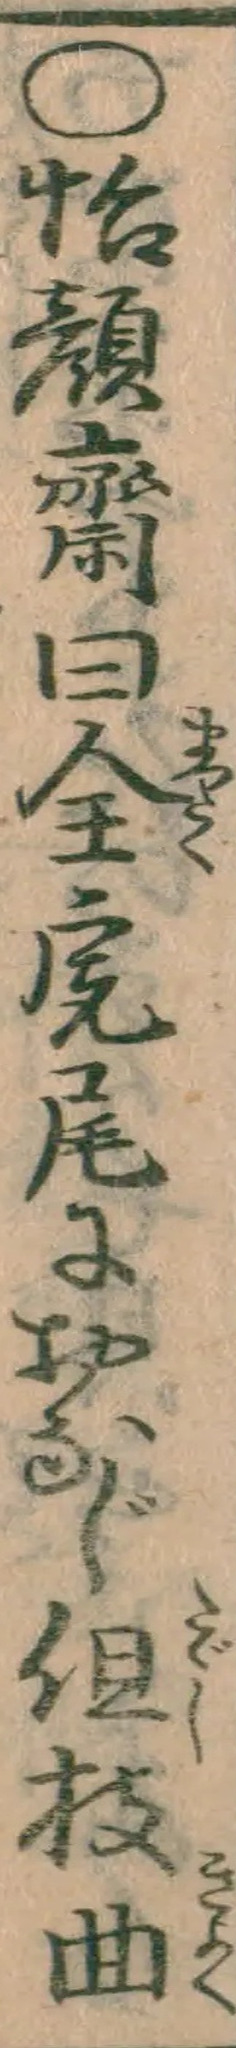○怡顔斎曰全虎尾におなじ但枝曲
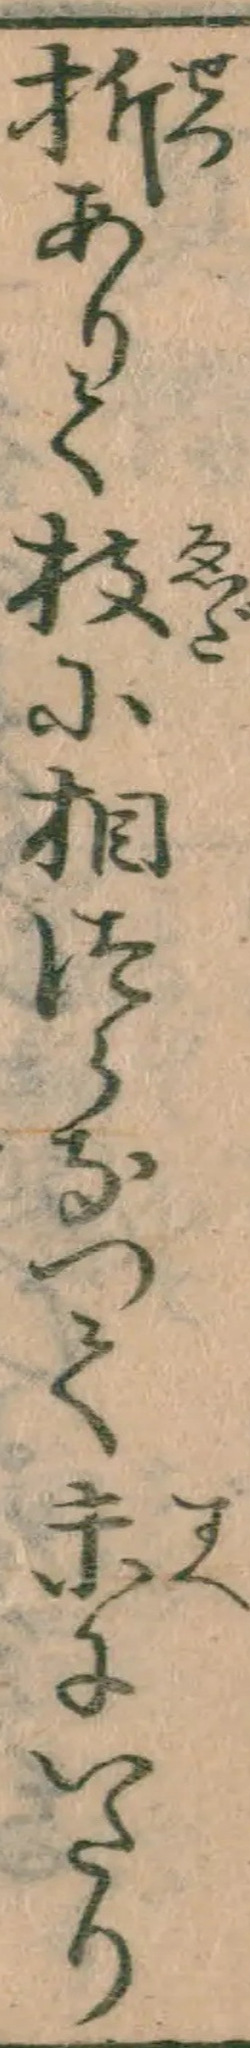折ありて枝に相つらなつて末にいたり
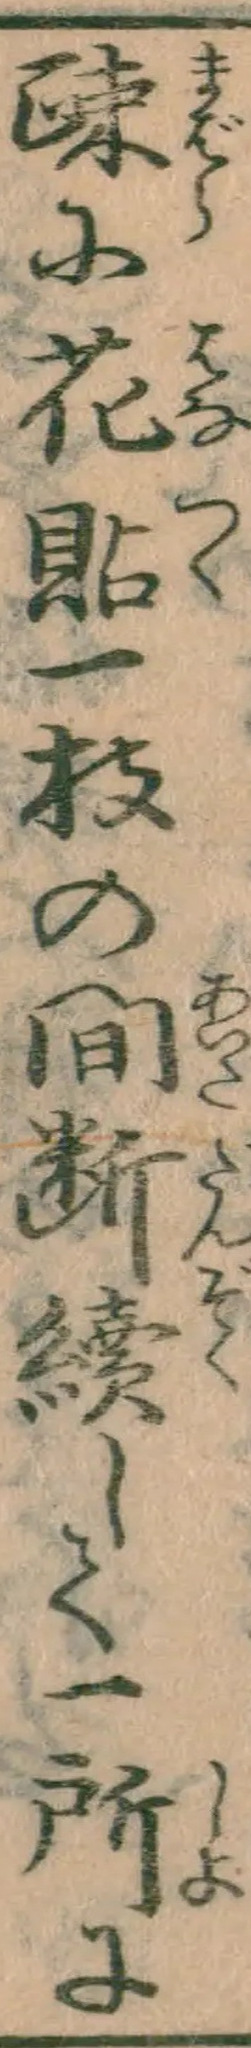疎に花貼一枝の間断続して一所に
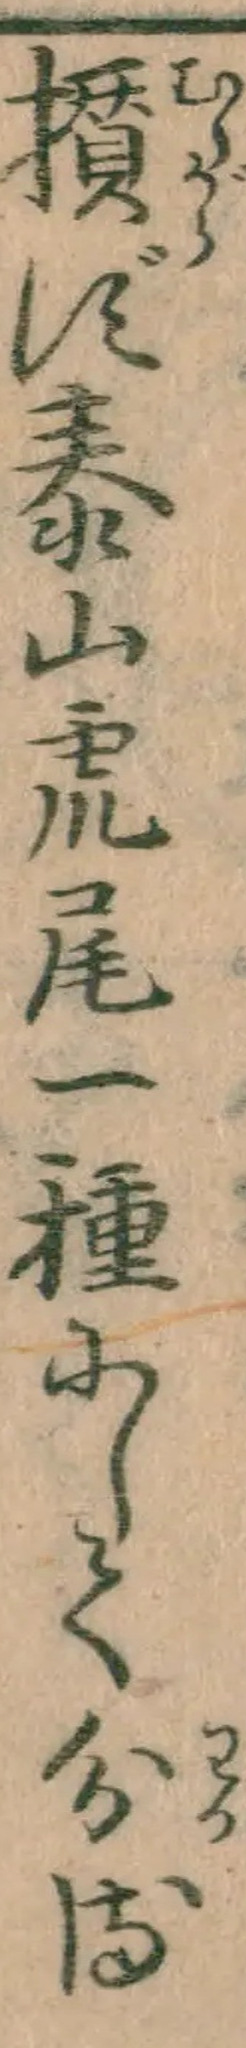欑ず泰山虎尾一種にして分る
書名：怡顔齋櫻品
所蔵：国立国会図書館 National Diet Library, JAPAN
